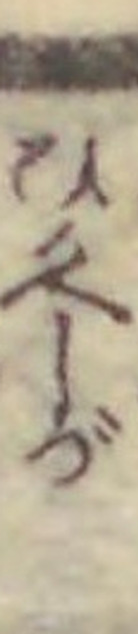ひかへしが
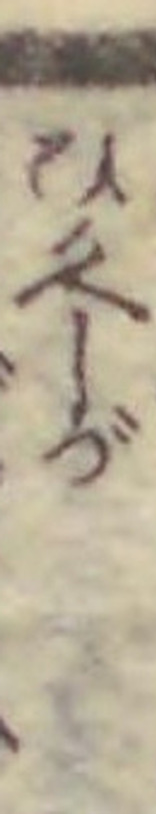ひかへしが
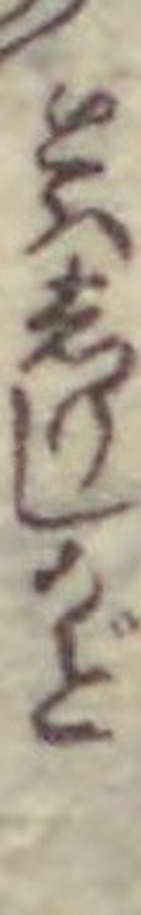とはしりしかど
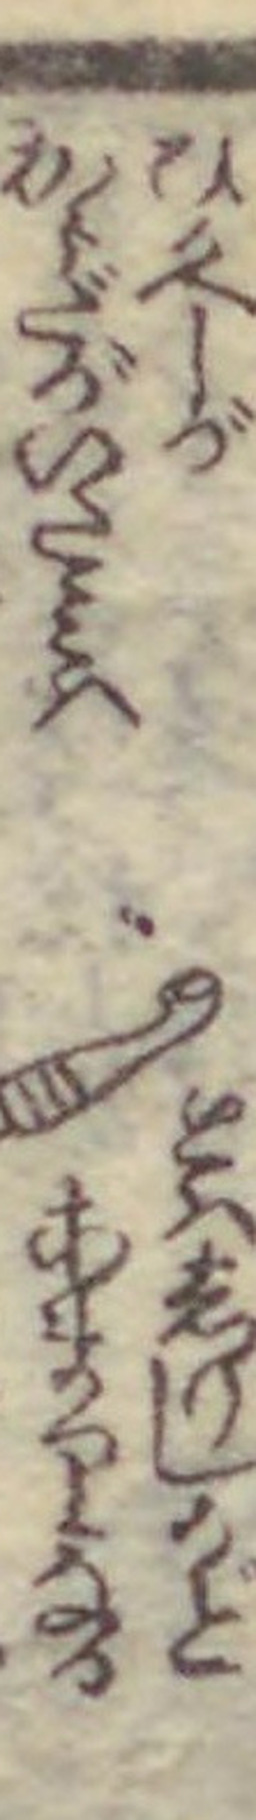からだがいたみは
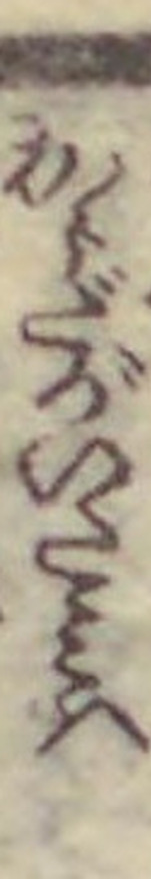からだがいたみは
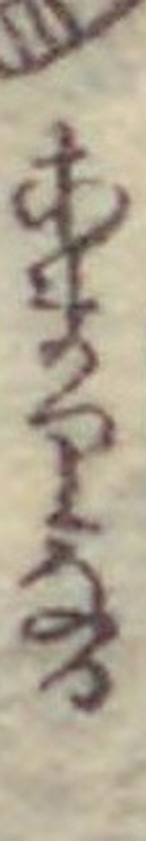あまりなる
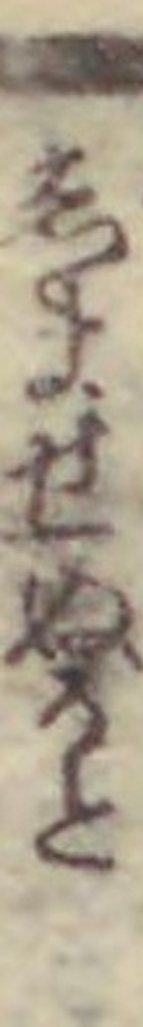しませぬかと
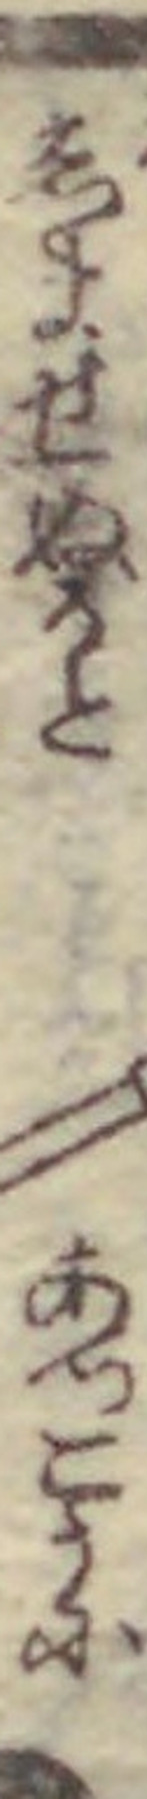しませぬかと
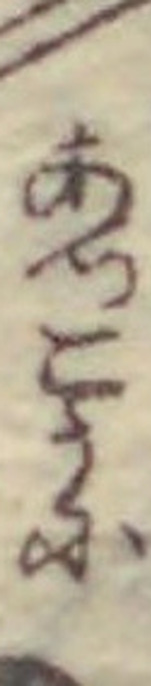あつこうに
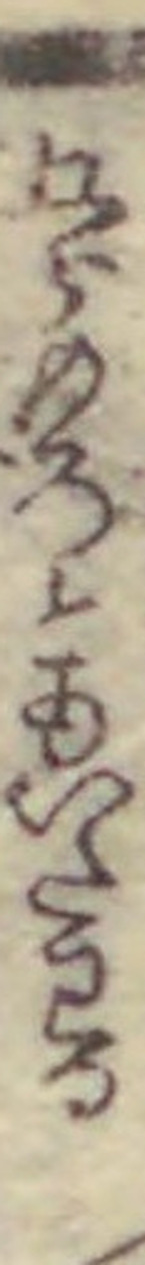五郎もろともいたわる
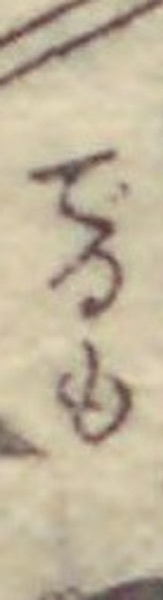でるも
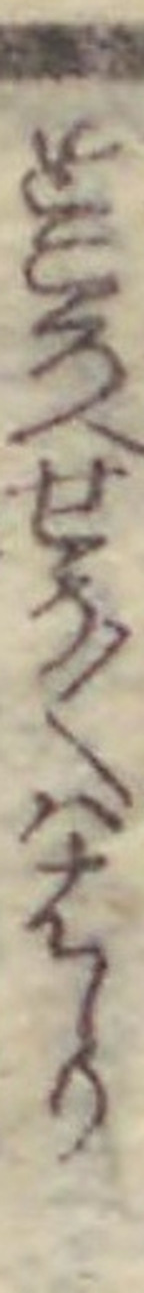ところへせう〳〵ははしり
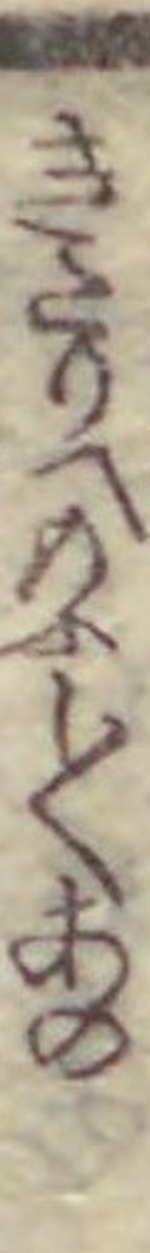きたり〽もふし〳〵あの
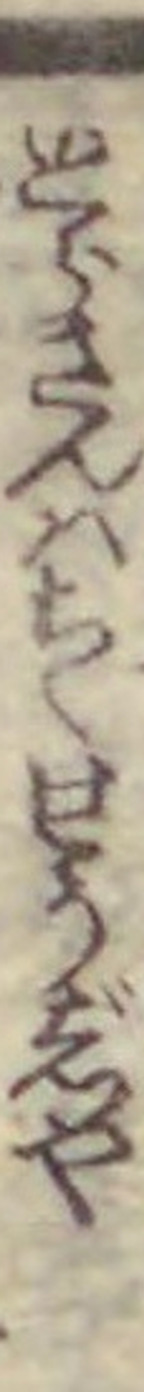とらさんはちくせうじや
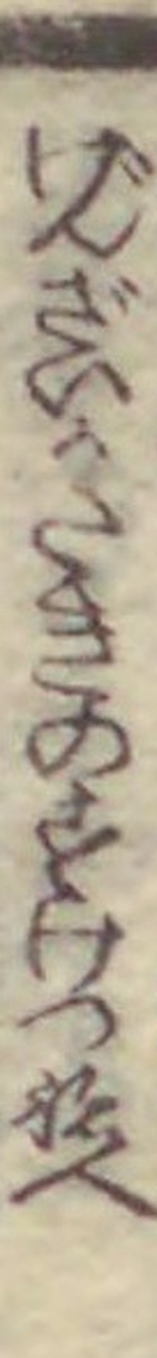げんざいかたきのすけつねへ
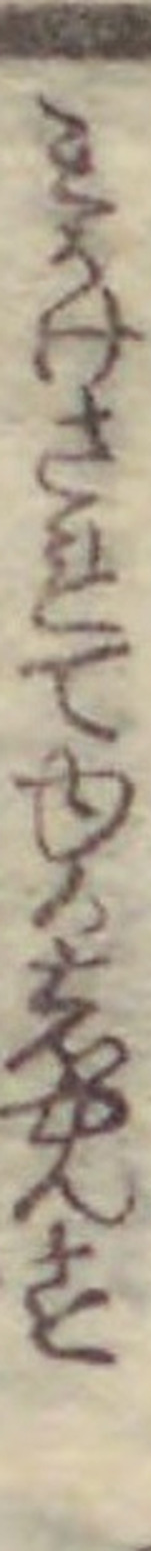みうけされてゆるしやんす
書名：大時代唐土化物 3巻. 曽我太夫染
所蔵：国立国会図書館 National Diet Library, JAPAN
